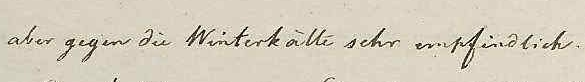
aber gegen die Winterkälte sehr empfindlich.
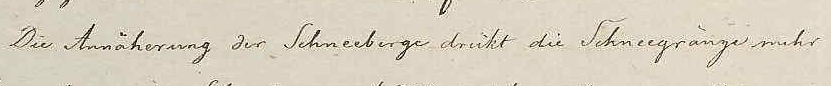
Die Annäherung der Schneeberge drükt die Schneegränze mehr
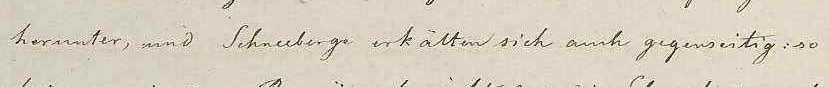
herunter, und Schneeberge erkälten sich auch gegenseitig: so
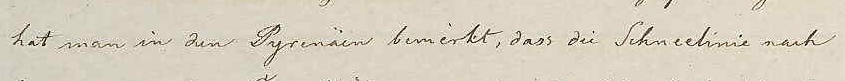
hat man in den Pyrenäen bemerkt, dass die Schneelinie nach
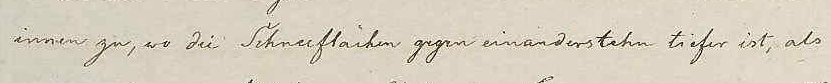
innen zu, wo die Schneeflächen gegen einanderstehn tiefer ist, als
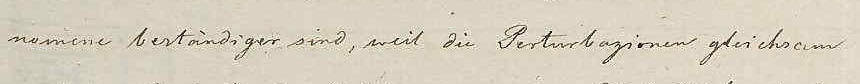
nomene beständiger sind, weil die Perturbazionen gleichsam
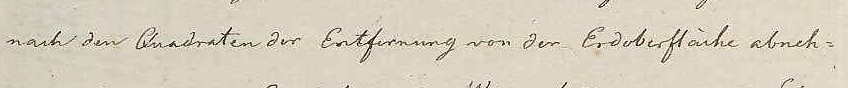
nach den Quadraten der Entfernung von der Erdoberfläche abneh-
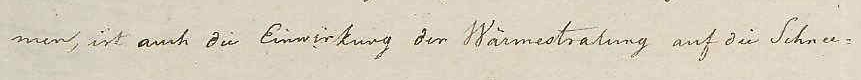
men, ist auch die Einwirkung der Wärmestralung auf die Schnee-
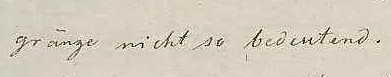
gränze nicht so bedeutend.
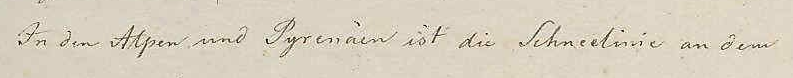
In den Alpen und Pyrenäen ist die Schneelinie an dem
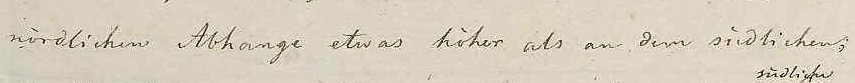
nördlichen Abhange etwas höher als an dem südlichen;
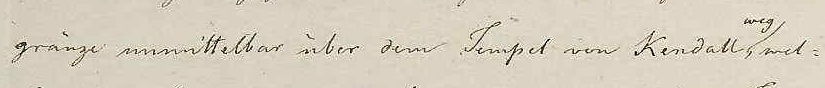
gränze unmittelbar über dem Tempel von Kendall weg, wel-
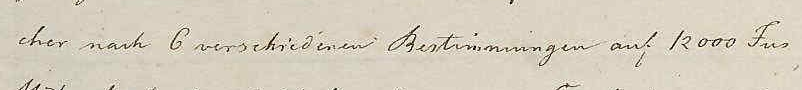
cher nach 6 verschiedenen Bestimmungen auf 12000 Fus
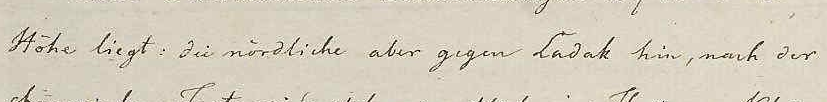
Höhe liegt: die nördliche aber dagegen Ladak hin, nach der
